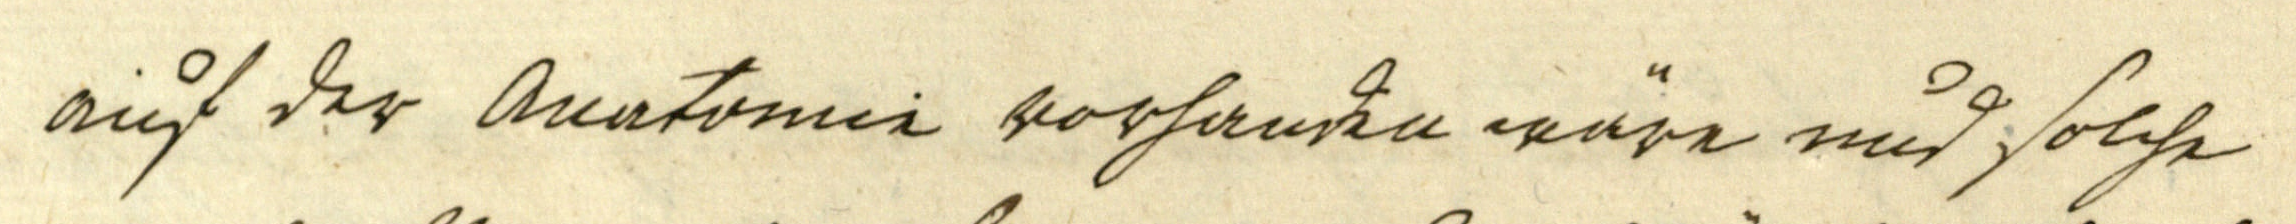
auf der Anatomie vorhanden wäre und solche
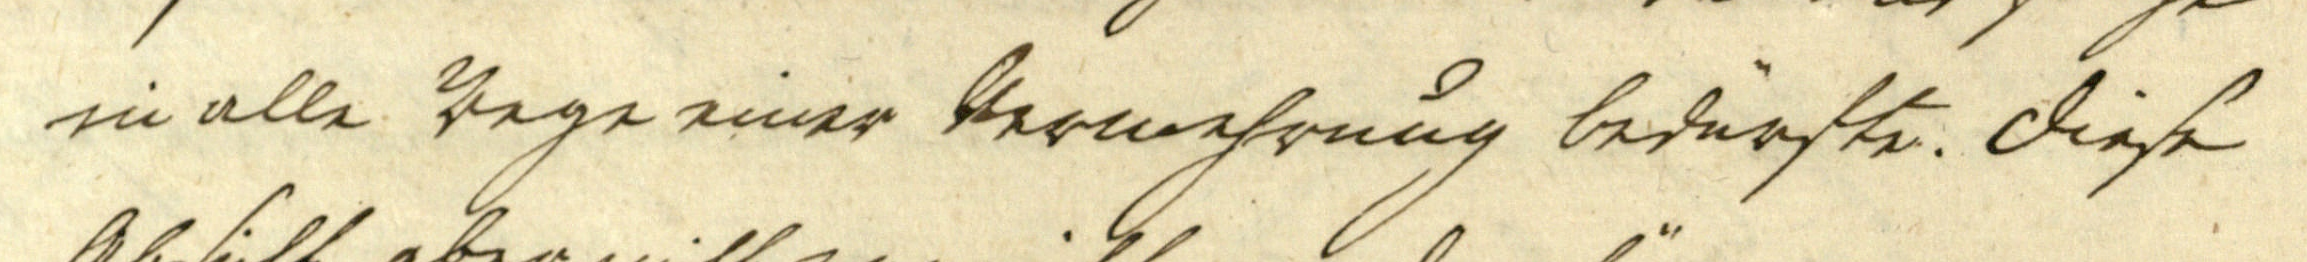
in alle Wege einer Vermehrung bedürfte. Diese
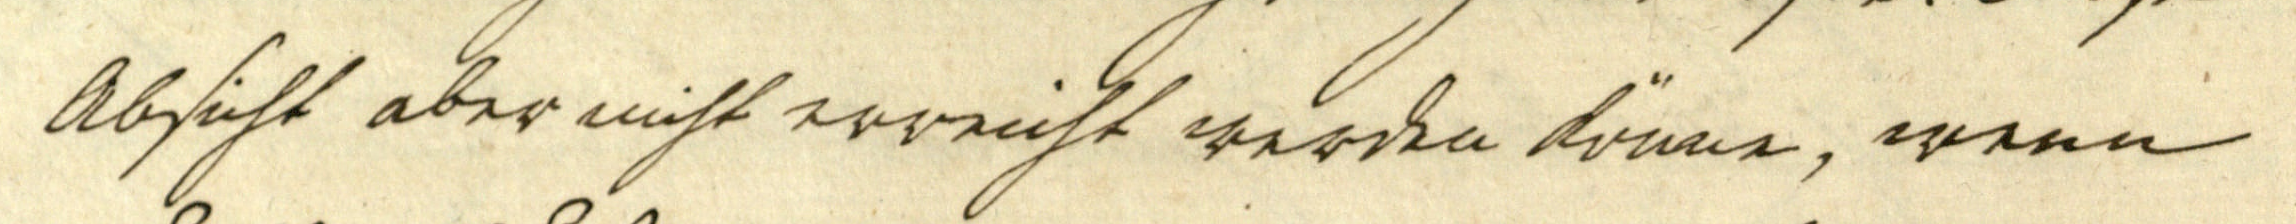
Absicht aber nicht erreicht werden könne, wenn
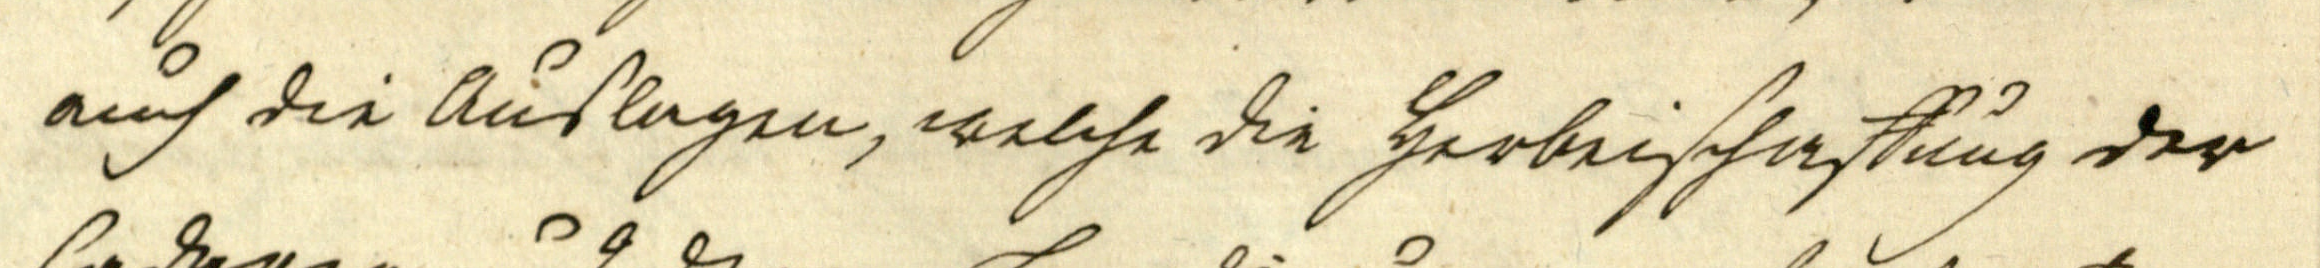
auch die Auslagen, welche die Herbeschaffung der
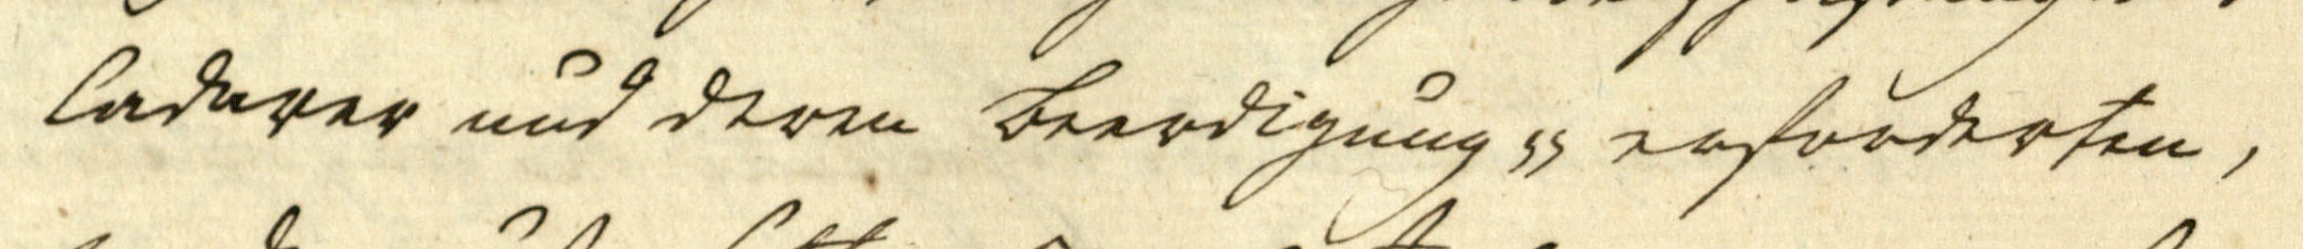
Cadaver und deren Beerdigung ,, erforderten,
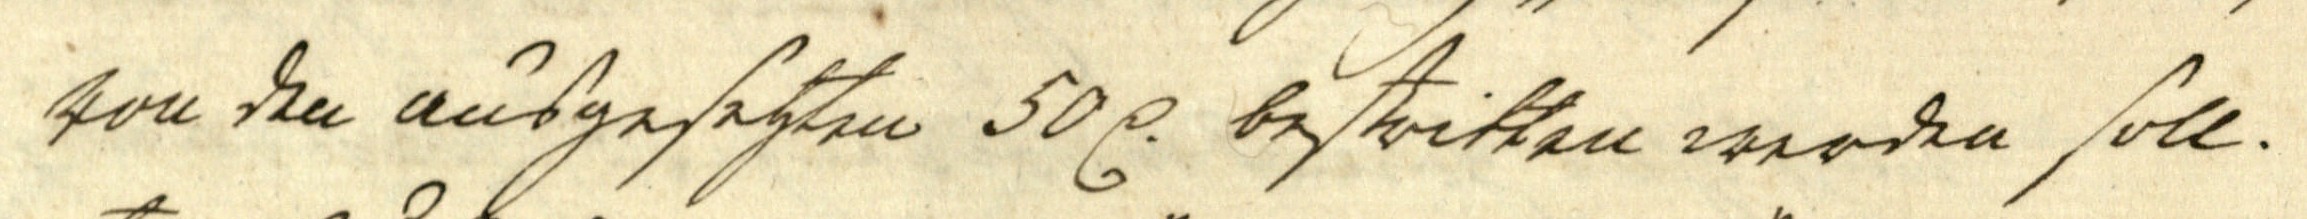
von den ausgesetzten 50 l. bestritten werden soll¬
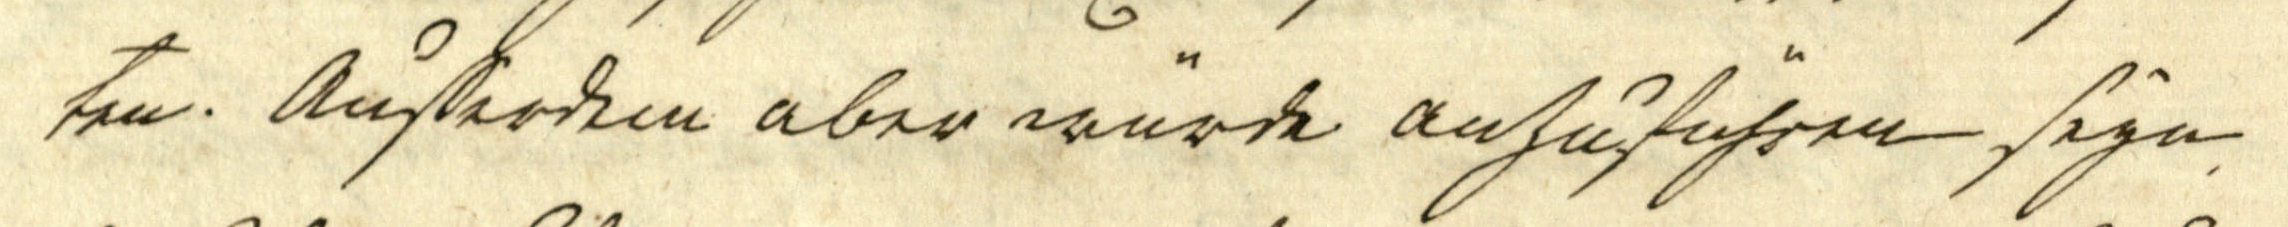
ten. Außerdem aber würde anzuführen seÿn,
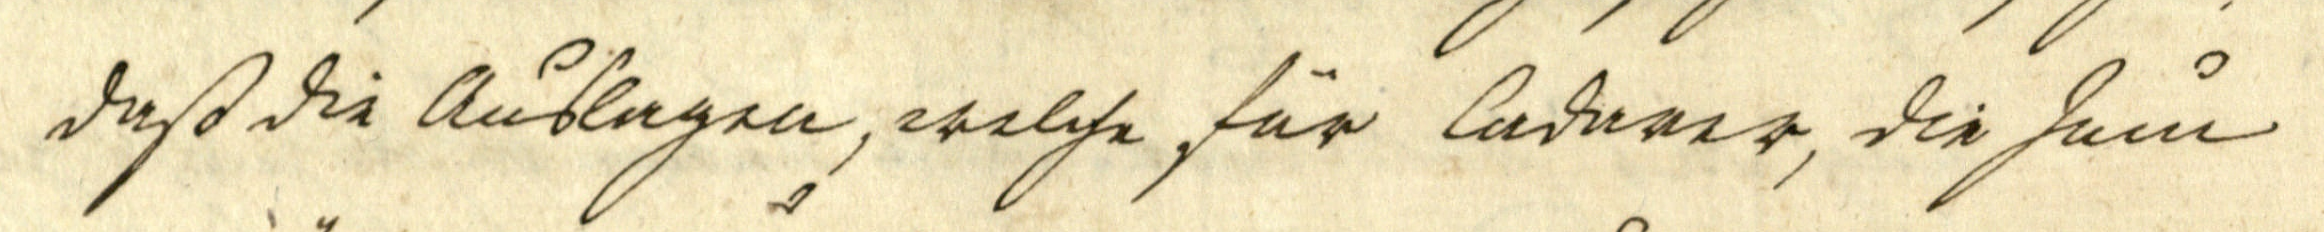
daß die Auslagen, welche für Cadaver, die zum
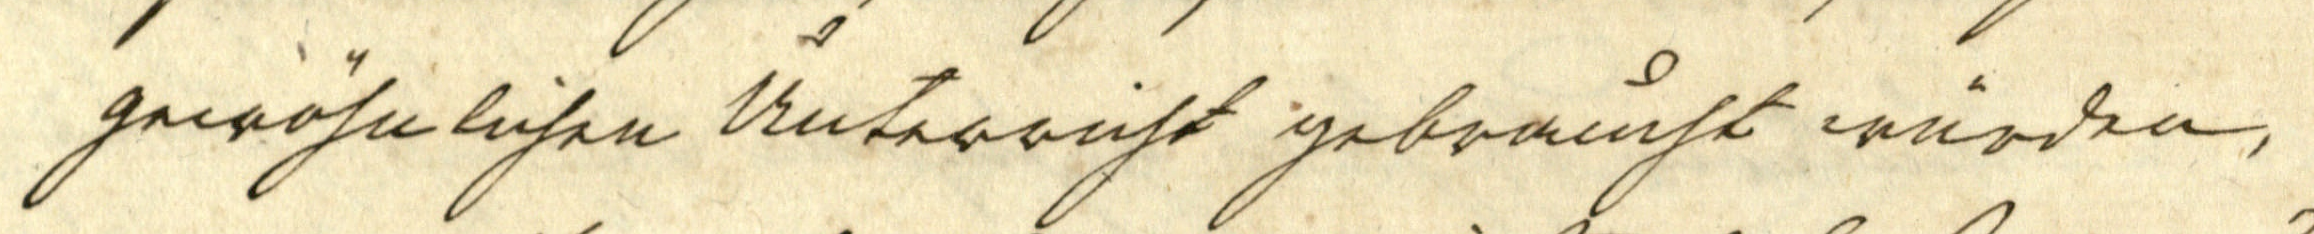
gewöhnlichen Unterricht gebraucht würden,
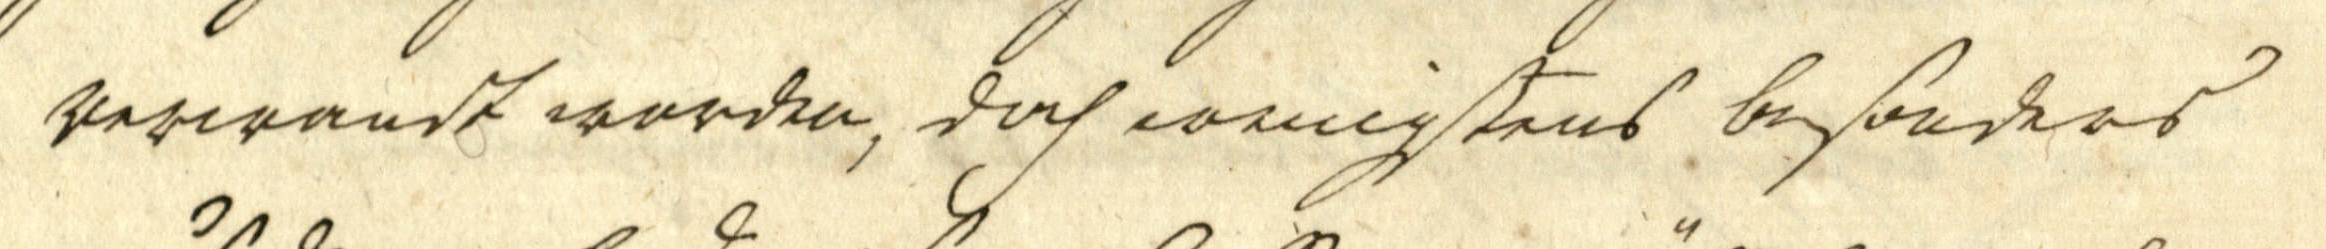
verwandt werden, doch wenigstens besonders
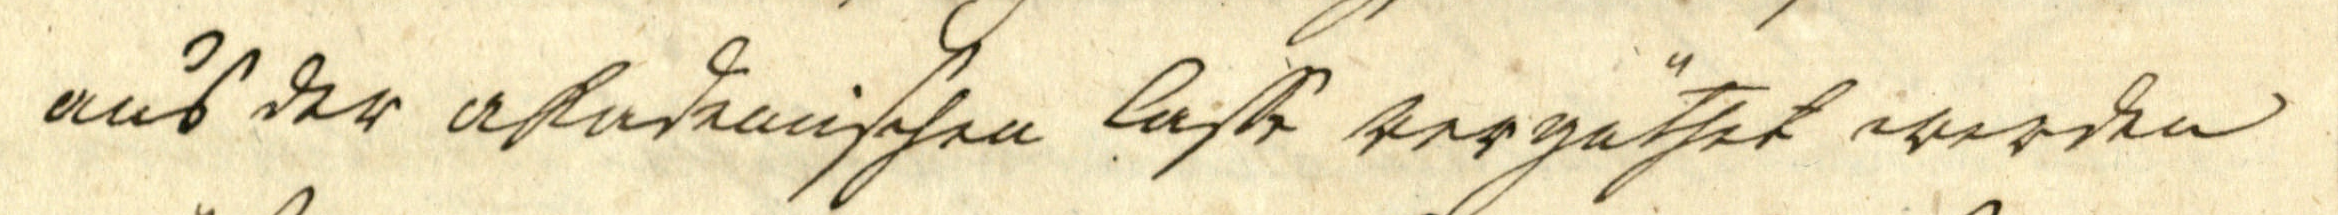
aus der akademischen Casse vergüthet werden
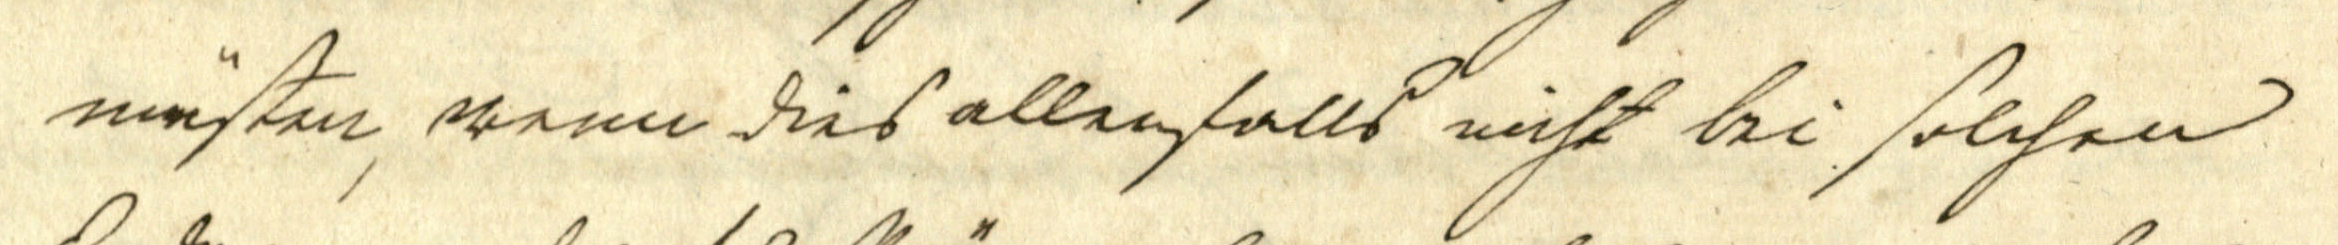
müsten, wenn dies allenfalls nicht bei solchen
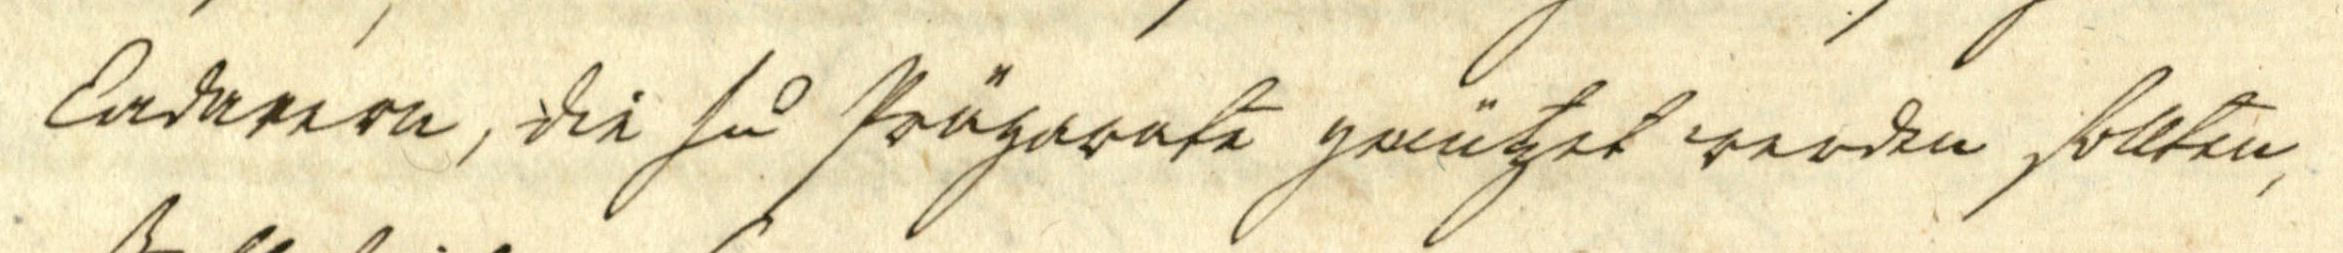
Cadavern, die zu Präparate genützet werden sollten,
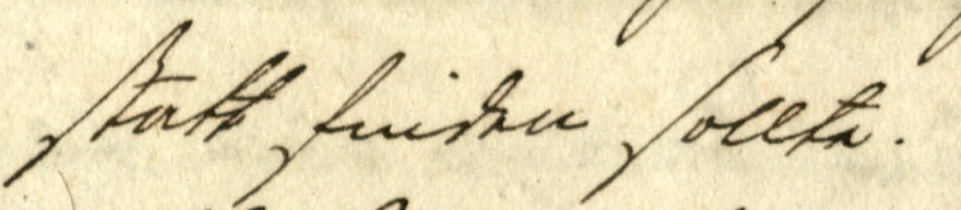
statt finden sollte.
